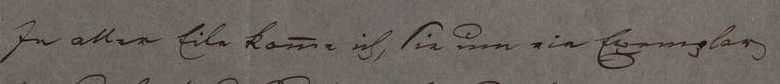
In aller Eile komme ich, Sie um ein Exemplar
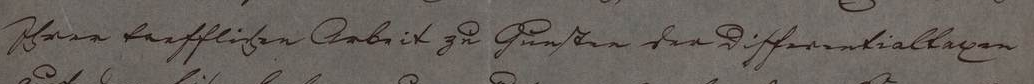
Ihrer trefflichen Arbeit zu Gunsten der Differentialtaxen
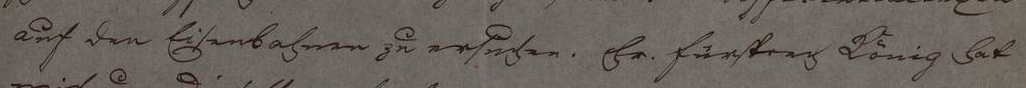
auf den Eisenbahnen zu ersuchen. Hr. Fürsprech König hat
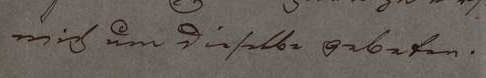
mich um dieselbe gebeten.
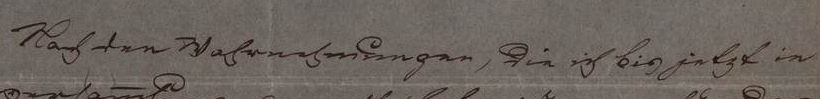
Nach den Wahrnehmungen, die ich bis jetzt in
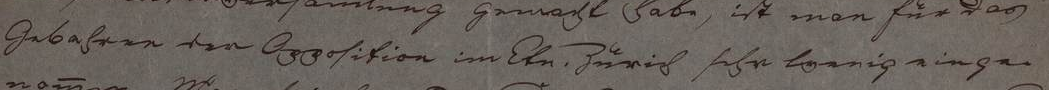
Gebahren der Opposition im Ctn. Zürich sehr wenig einge-
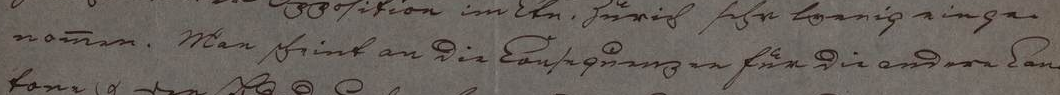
nommen. Man scheint an die Consequenzen für die andern Can-
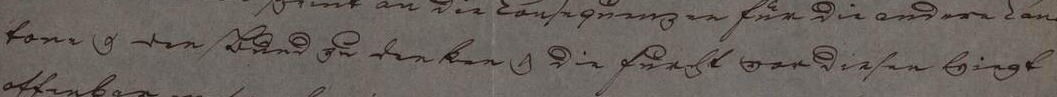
tone & den Bund zu denken & die Furcht vor diesen wiegt
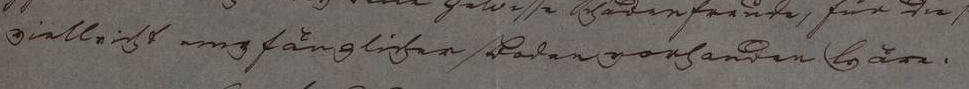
vielleicht empfänglicher Boden vorhanden wäre.
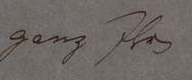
ganz Ihr
